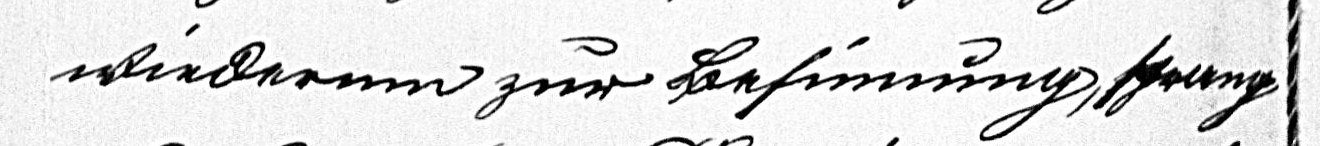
wiederum zur Besinnung, sprang
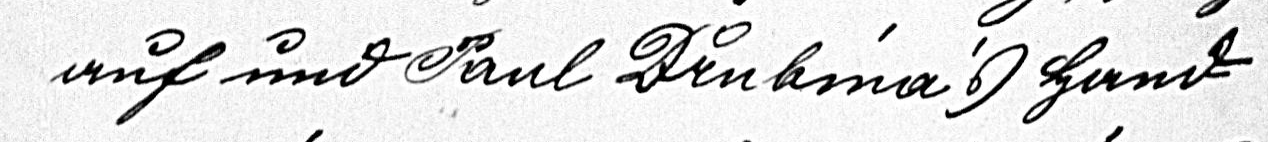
auf und Paul Drubina's Hand
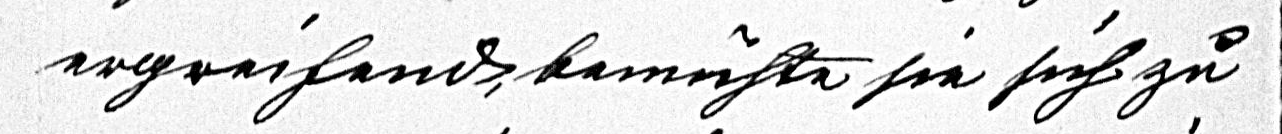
ergreifend, bemühte sie sich zu
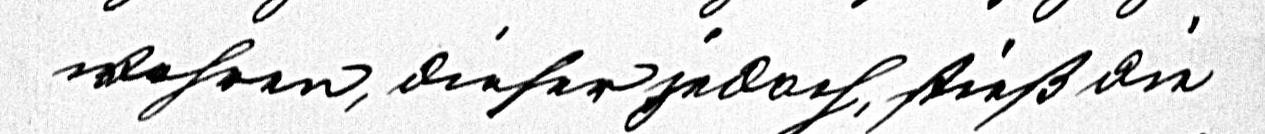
wehren, dieser jedoch,stieß die
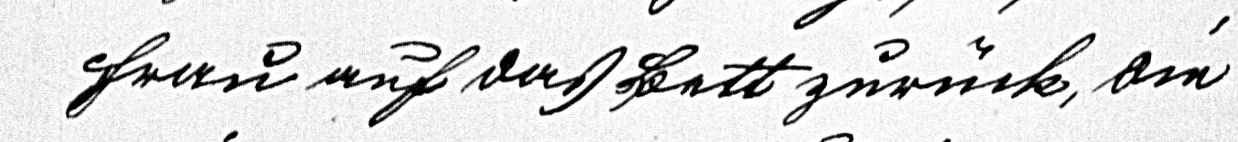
Frau auf das Bett zurück, die
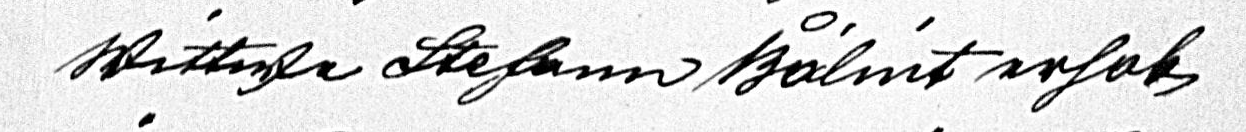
Wittwe Stefann Bálint erhob
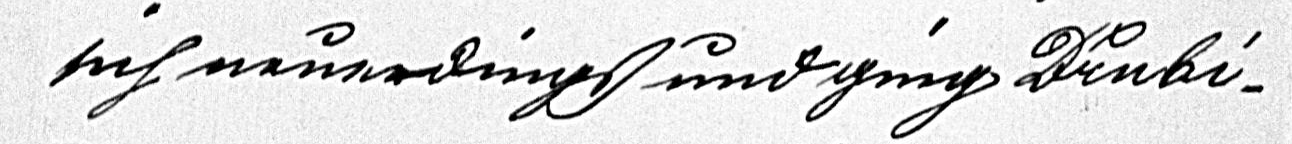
sich neuerdings und ging Drubi¬
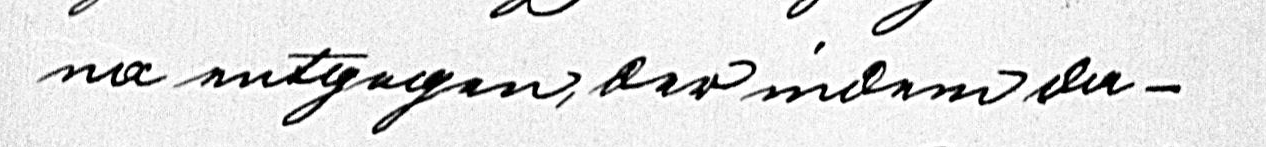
na entgegen, der indem da¬
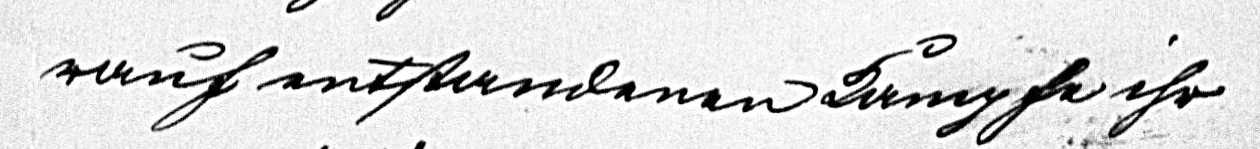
rauf entstandenen Kampfe ihr
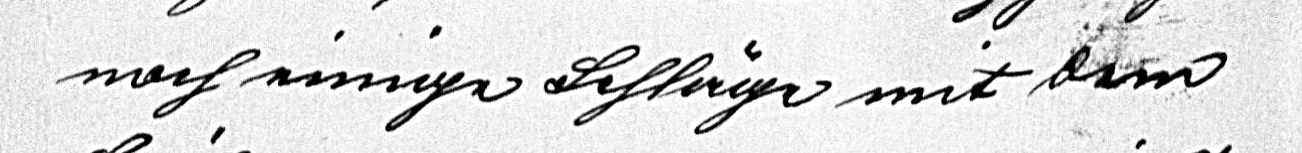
noch einige Schläge mit dem
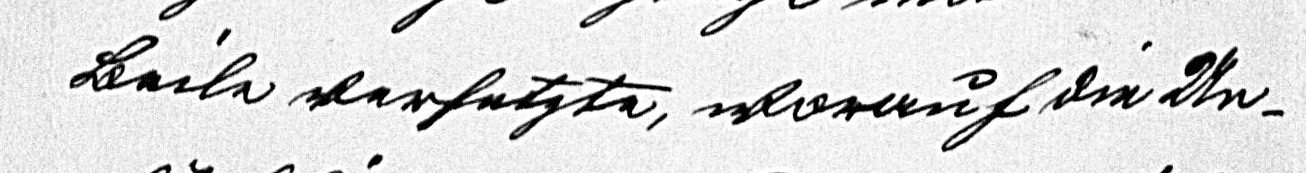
Beile versetzte, worauf die Un¬
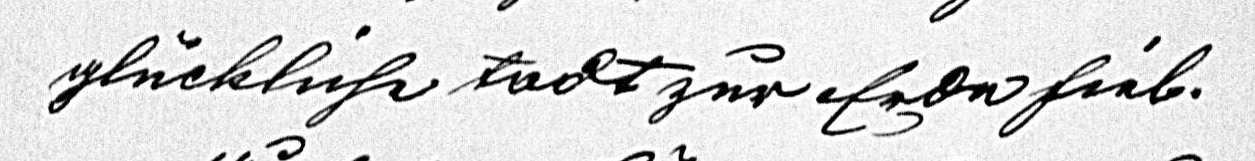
glückliche todt zur Erde fiel.
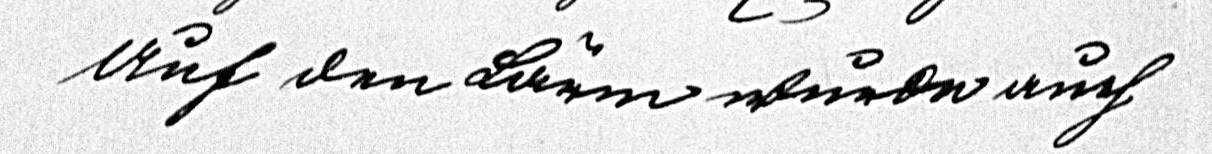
Auf den Lärm wurde auch
